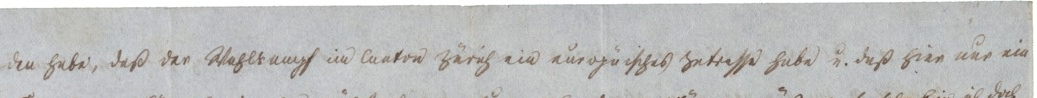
Canton Zürich ein europäisches Intresse habe u. daß hier nur ein
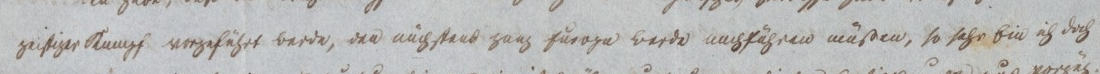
gesitiger Kampf vorgeführt werde, den nächstens ganz Europa werde nachführen müssen, so sehr bin ich doch
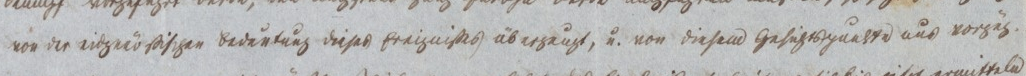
von der eidgenössischen Bedeutung dieses Ereignisses überzeugt, u. von diesem Gesichtspunkte aus vorzüg-
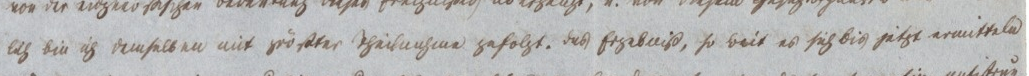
lich bin ich demselben mit größter Theilnahme gefolgt. Das Ergebniß, so weit es sich bis jetzt ermitteln
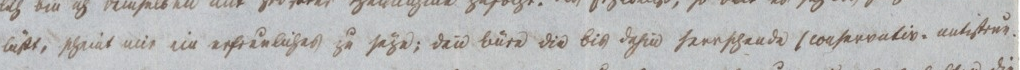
läßt, scheint mir ein erfreuliches zu seyn; denn wäre die bis dahin herrschende (conservativ-antistrau-
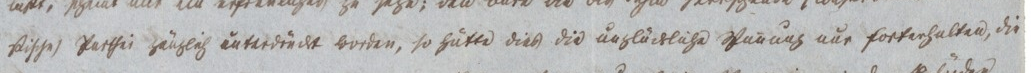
ßische) Parthei gänzlich unterdrückt worden, so hätte dies die unglückliche Spannung nur forterhalten, die
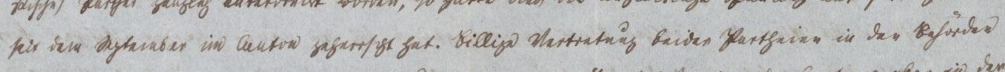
seit dem September im Canton geherrscht hat. Billige Vertretung beider Partheien in den Behörden
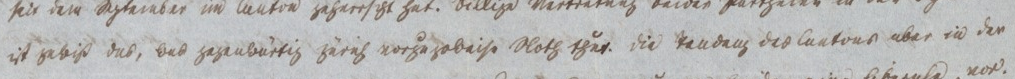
ist gewiß das, was gegenwärtig Zürich vorzugsweise Noth thut. Die Tendenz des Cantons aber in der
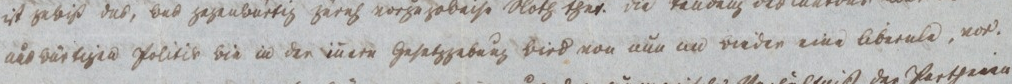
auswärtigen Politik wie in der innern Gesetzgebung wird von nun an wieder eine liberale, vor-
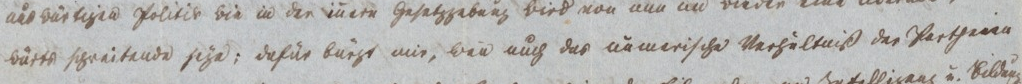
wärts schreitende seyn; dafür bürgt mir, wenn auch das numerische Verhältniß der Partheien
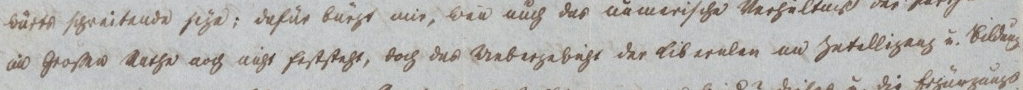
im Grossen Rathe noch nicht feststeht, doch das Uebergewicht der Liberalen an Intelligenz u. Bildung.
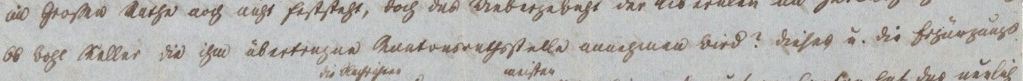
Ob wohl Keller die ihm übertragne Kantonsrathsstelle annehmen wird? Dieses u. die Ergänzungs-
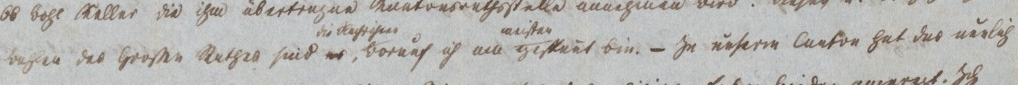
wahlen des Grossen Rathes sind esdie Nachrichten, worauf ich am meisten gespannt bin. – In unserm Canton hat das neulich
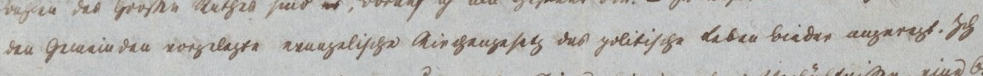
den Gemeinden vorgelegte evangelische Kirchengesetz das politische Leben wieder angeregt. Ich
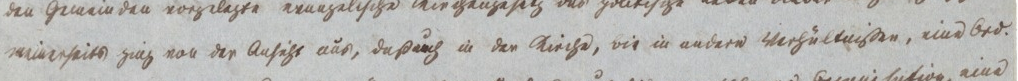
meinerseits ging von der Ansicht aus, daß auch in der Kirche, wie in andern Verhältnissen, eine Ord-
